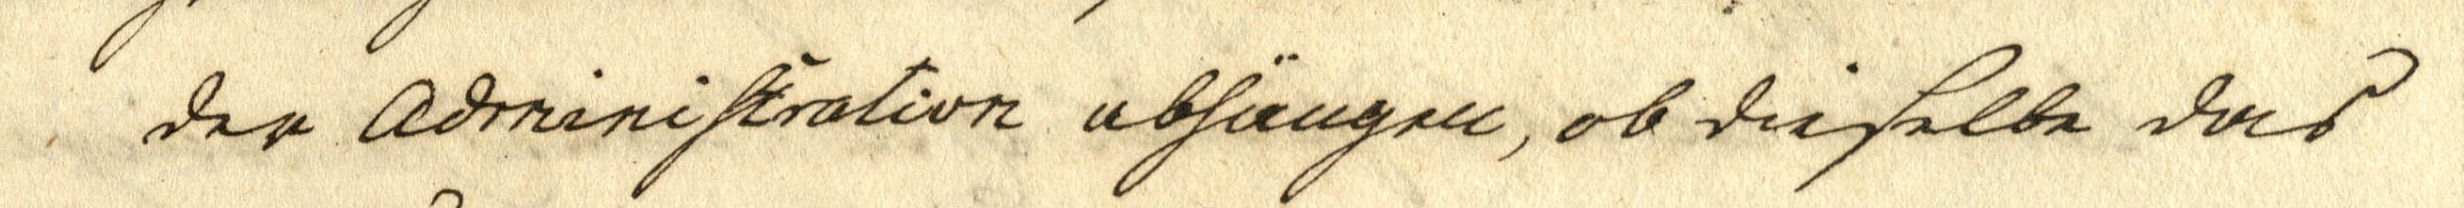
der Administration abhängen, ob dieselbe das
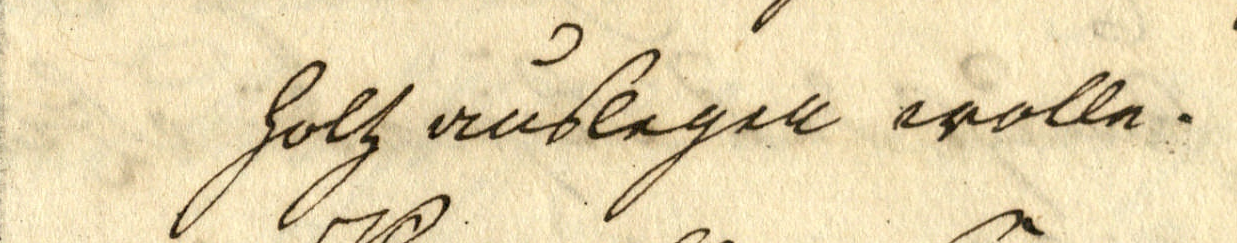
Holtz auslegen wolle.
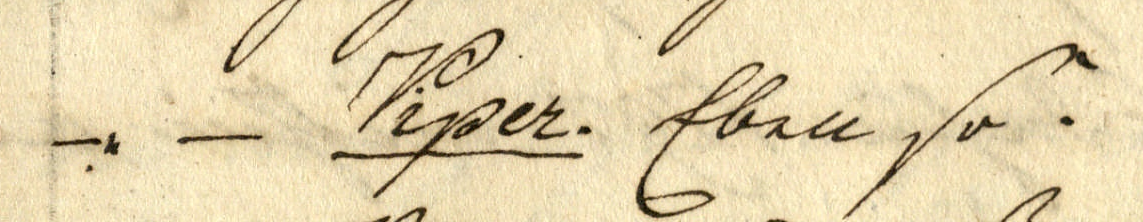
- " - Piper. Eben so.
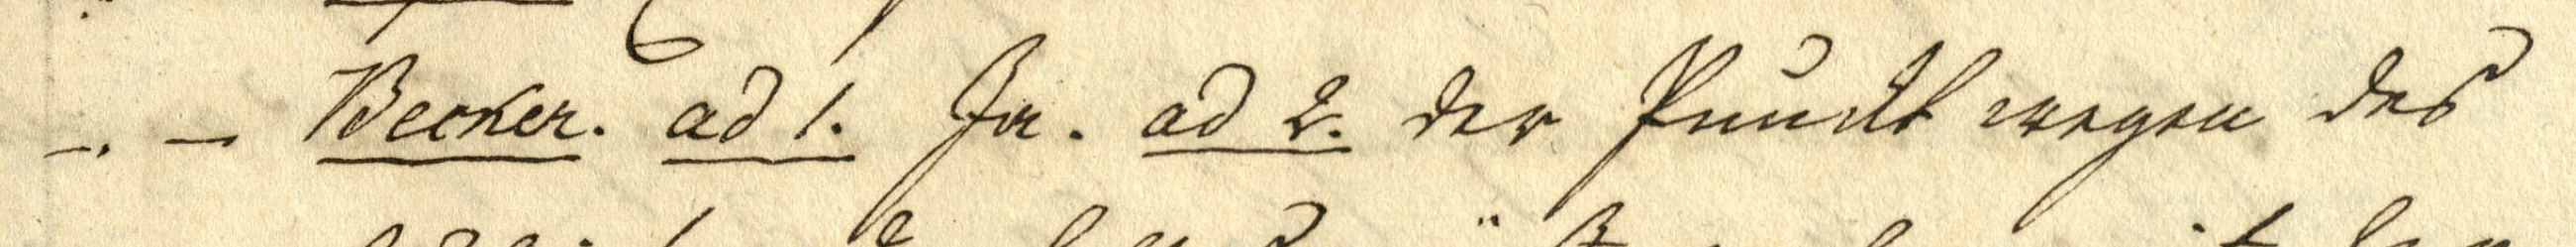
- " - Becker. ad 1. Ja. ad 2. der Punkt wegen des
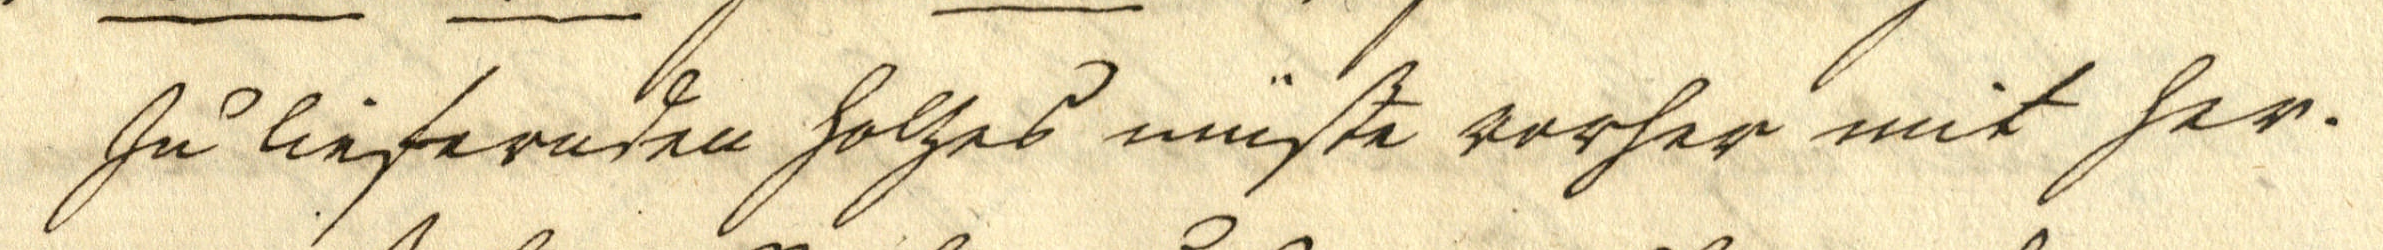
zu liefernden holtzes müßte vorher mit her-
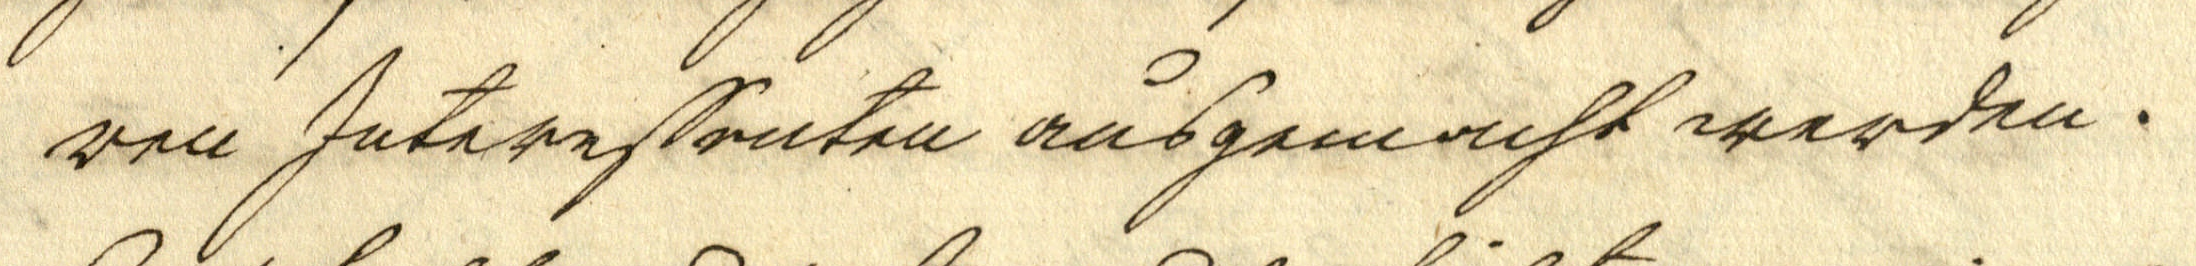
ren Interessenten ausgemacht werden.
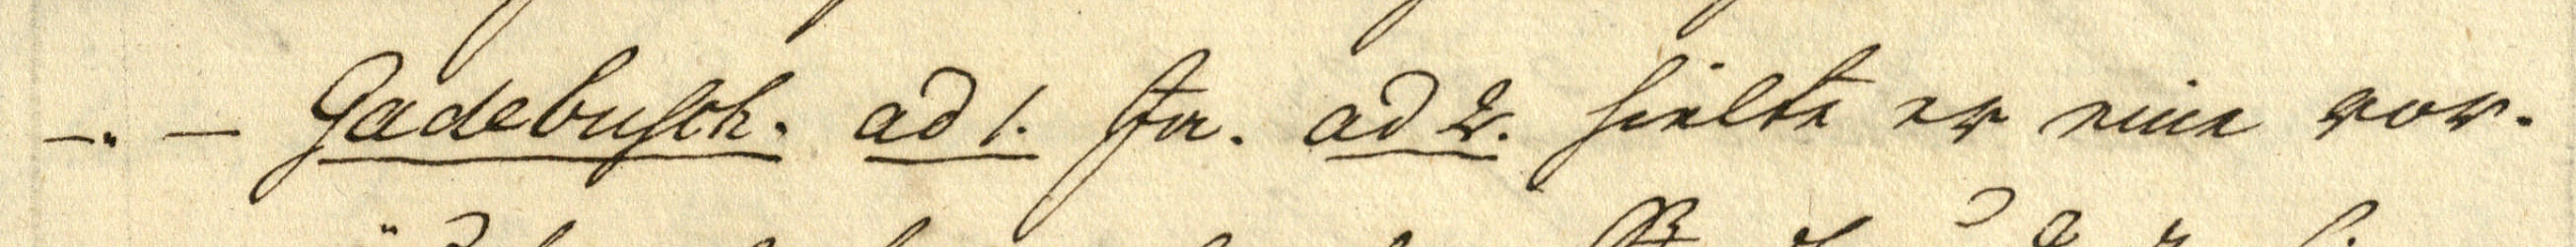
- " - Gadebusch. ad 1. Ja. ad 2. hielte er eine vor-
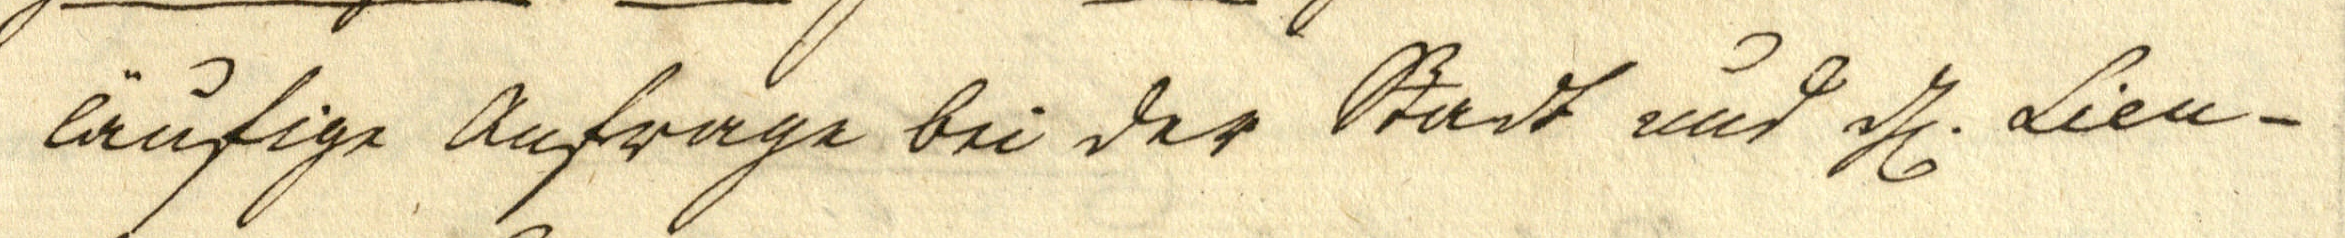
läufige Anfrage bei der Stadt und dh. Lieu-
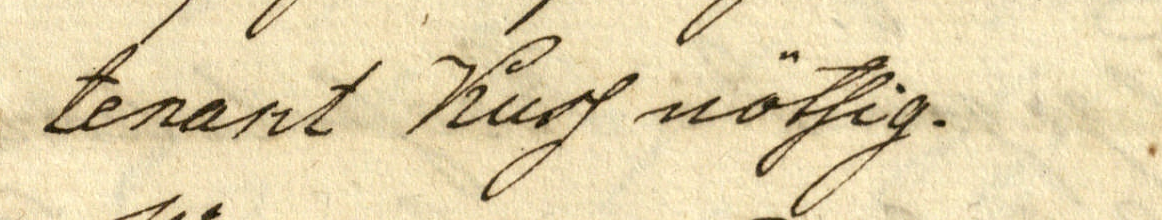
tenant Kuss nöthig.
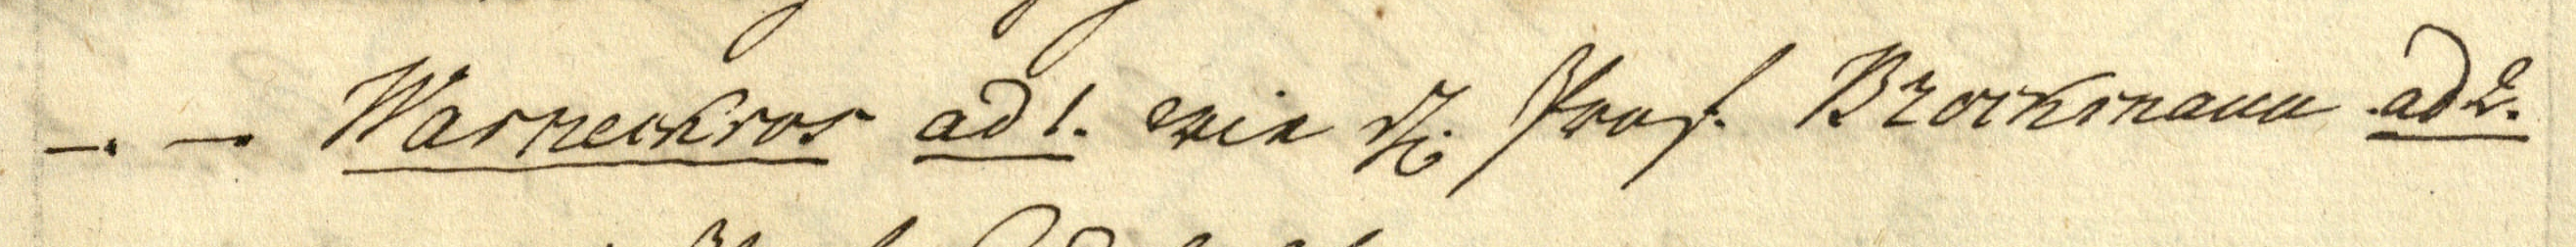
- " - Warneckros ad 1. wie dh. Prof. Brockmann. ad 2.
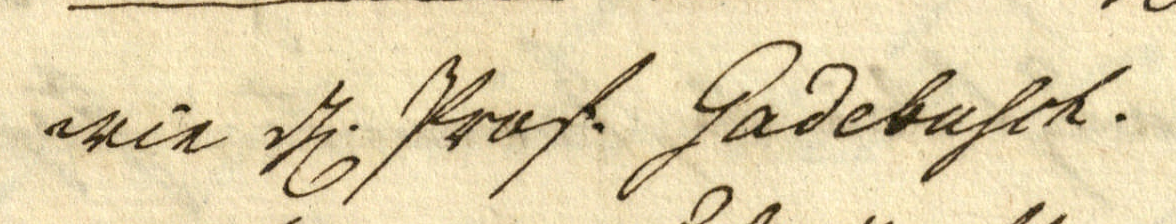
wie dh. Prof. Gadebusch.
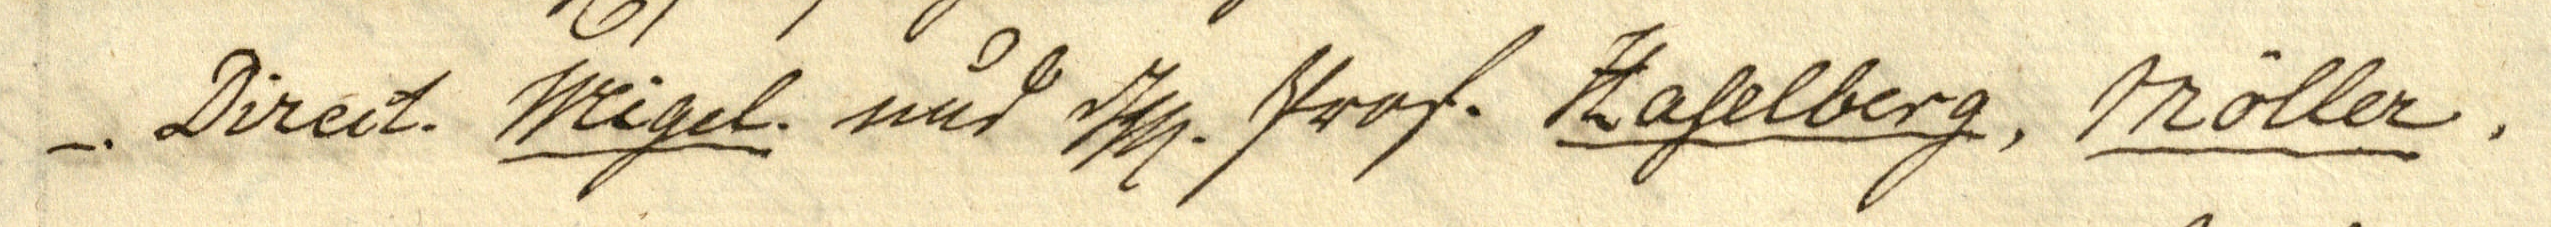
- Direct. Weigel. und dhh. Prof. Haselberg, Möller,
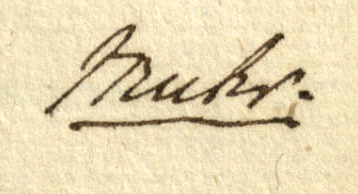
Muhr-
